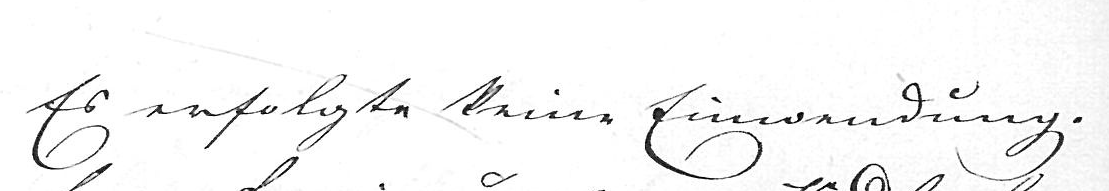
Es erfolgte keine Einwendung.
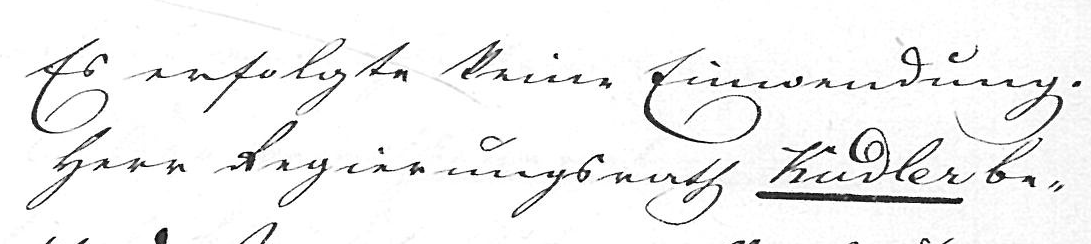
Herr Regierungsrath Kudler be-
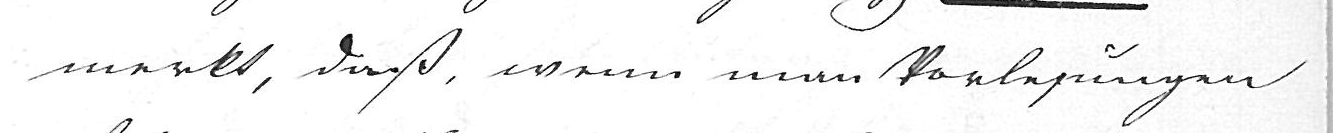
merkt, daß, wenn man Vorlesungen
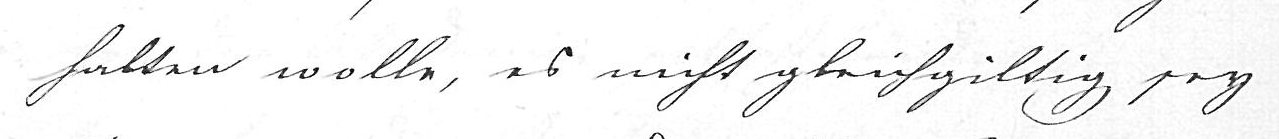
halten wolle, es nicht gleichgiltig sey
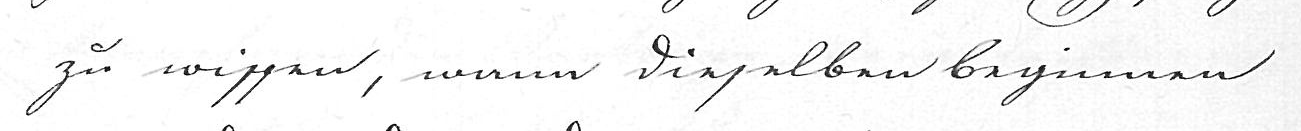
zu wissen, wann dieselben beginnen
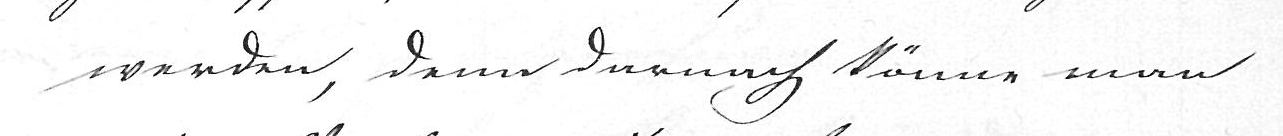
werden, denn darnach könne man
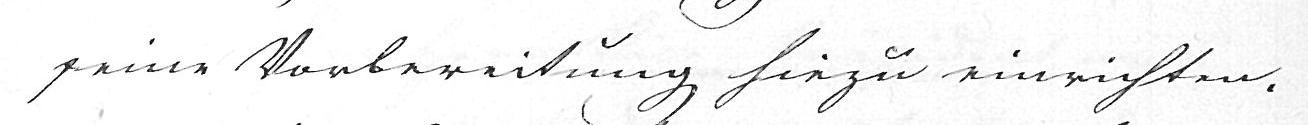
seine Vorbereitung hiezu einrichten.
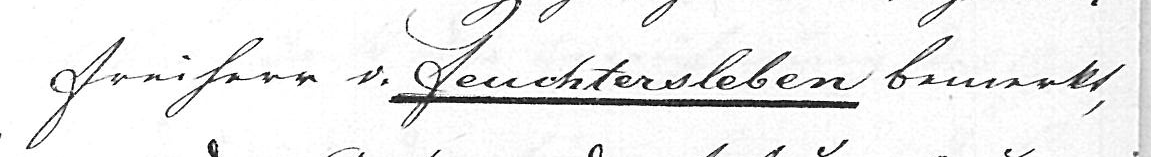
Freiherr v. Feuchtersleben bemerkt,
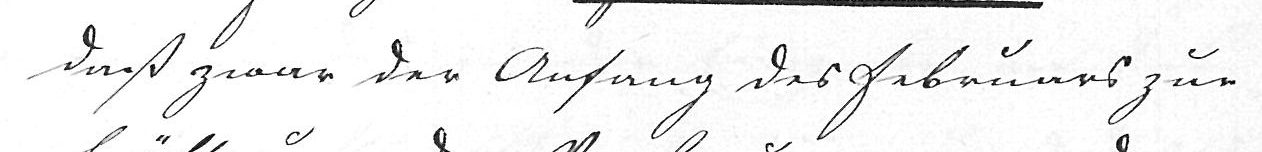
daß zwar der Anfang des Februars zur
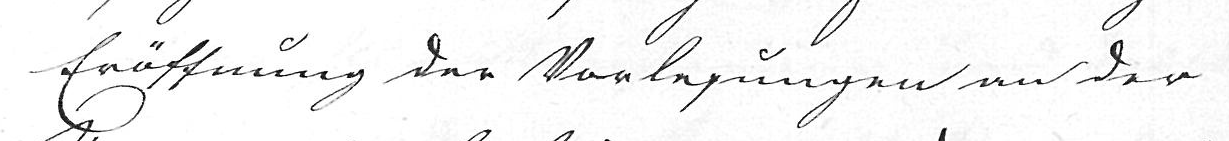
Eröffnung der Vorlesungen an der
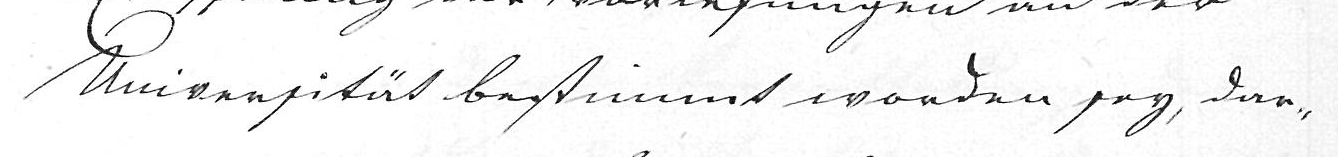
Universität bestimmt worden sey, dar-
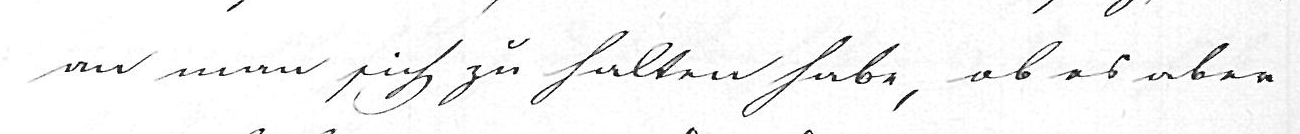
an man sich zu halten habe, ob es aber
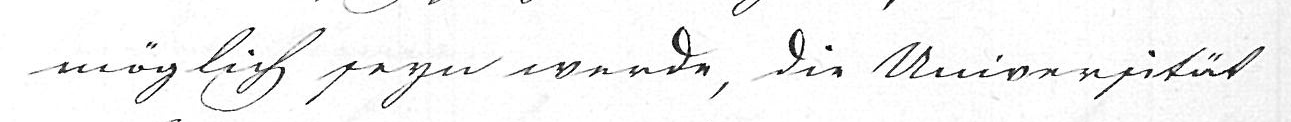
möglich seyn werde, die Universität
